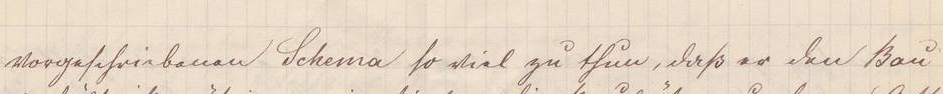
vorgeschriebenen Schema so viel zu thun, daß er den Bau
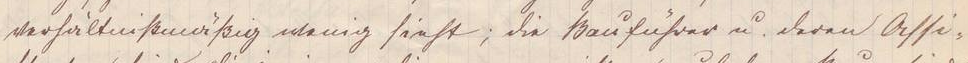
verhältnißmäßig wenig sieht; die Bauführer u. deren Assi-
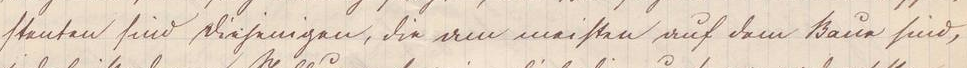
stenten sind diejenigen, die am meisten auf dem Baue sind,
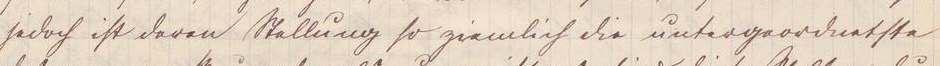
jedoch ist deren Stellung so ziemlich die untergeordnetste
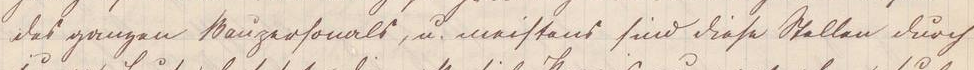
des ganzen Baupersonals, u. meistens sind diese Stellen durch
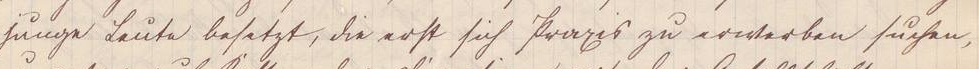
junge Leute besetzt, die erst sich Praxis zu erwerben suchen,
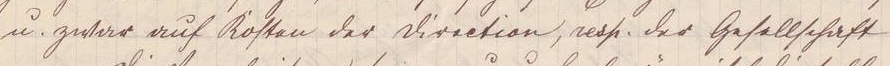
u. zwar auf Kosten der Direction, resp. der Gesellschaft.
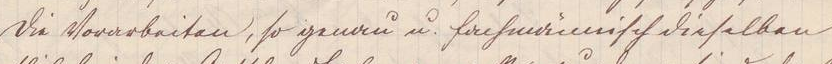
Die Vorarbeiten, so genau u. fachmännisch dieselben
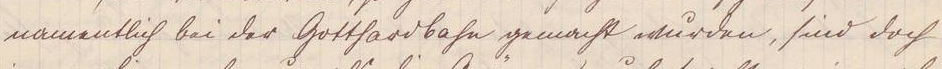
namentlich bei der Gotthardbahn gemacht wurden, sind doch
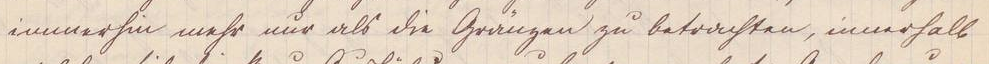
immerhin mehr nur als die Gränzen zu betrachten, innerhalb
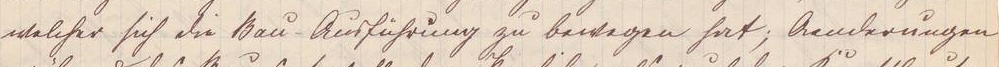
welcher sich die Bau-Ausführung zu bewegen hat; Aenderungen
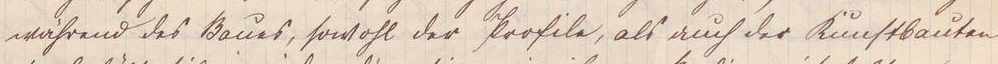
während des Baues, sowohl der Profile, als auch der Kunstbauten
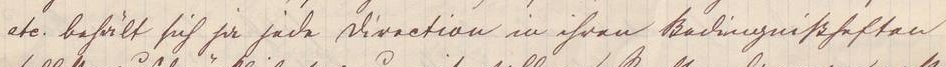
etc. behält sich ja jede Direction in ihren Bedingnißheften
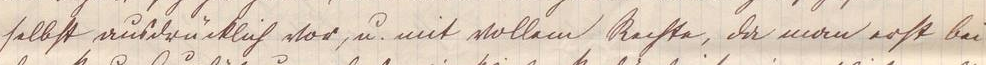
selbst ausdrücklich vor, u. mit vollem Rechte, da man erst bei
